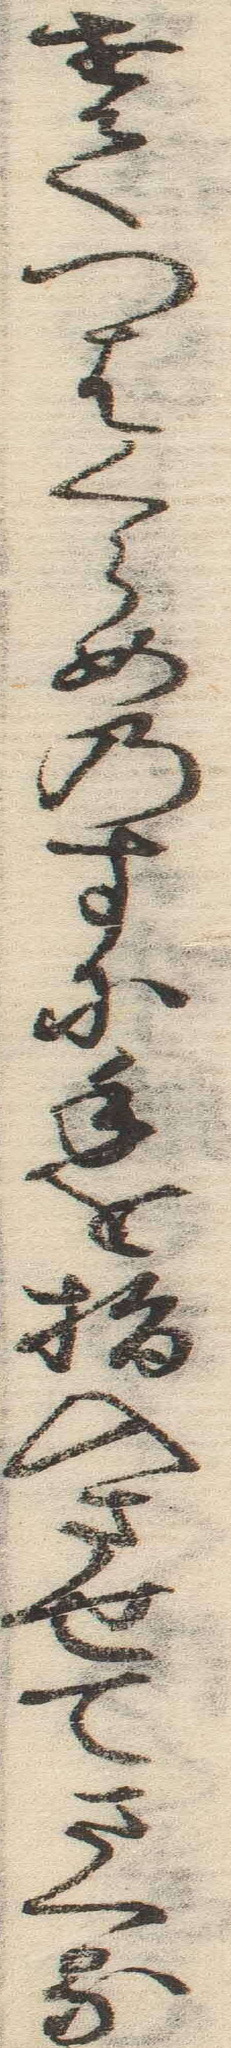せてつはくらめのすに手を指入させてさくる

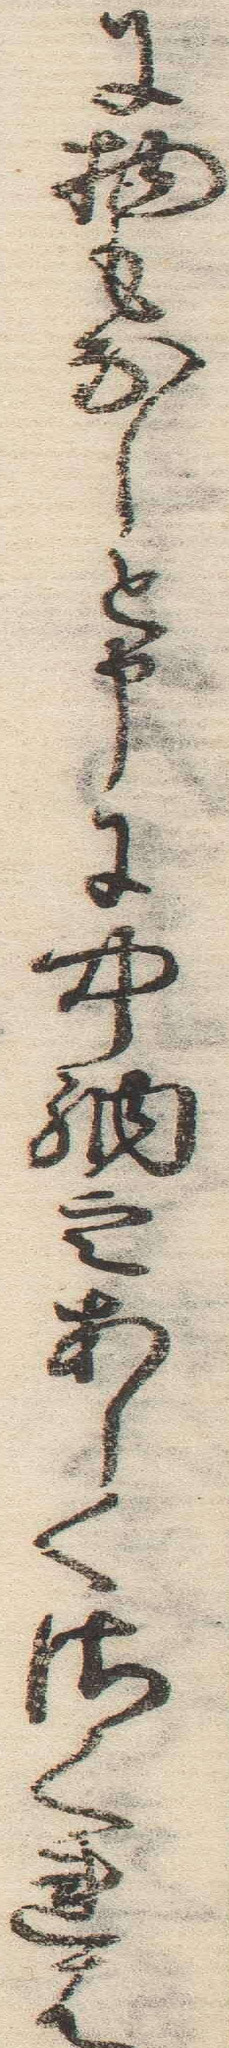に物もなしと申に中納言あしくさくれは
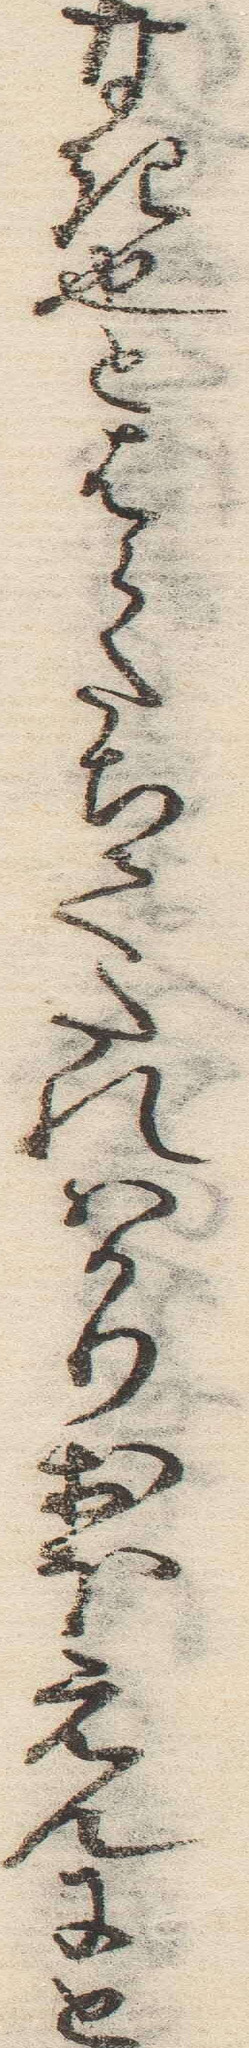なき也とはらたちてたれはかりおほえんにと
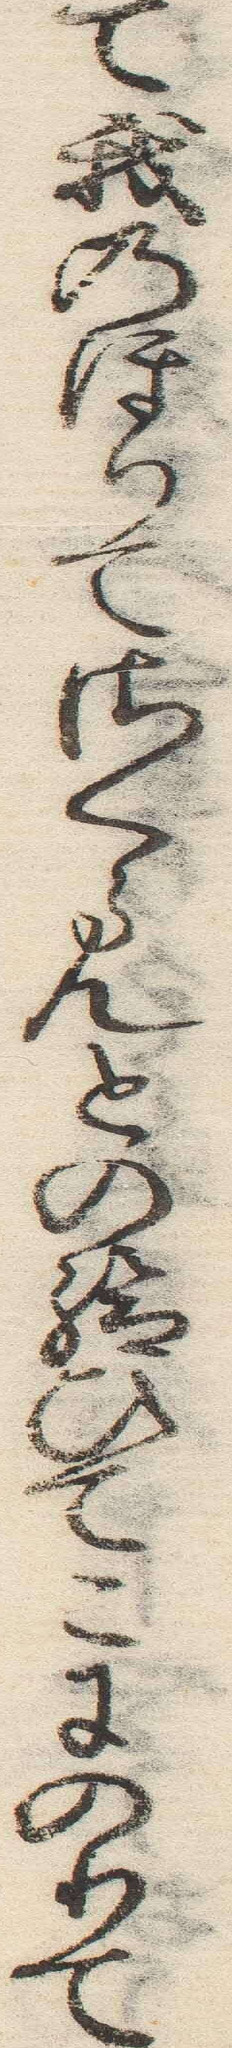て我のほりてさくらんとの給ひてこにのりて
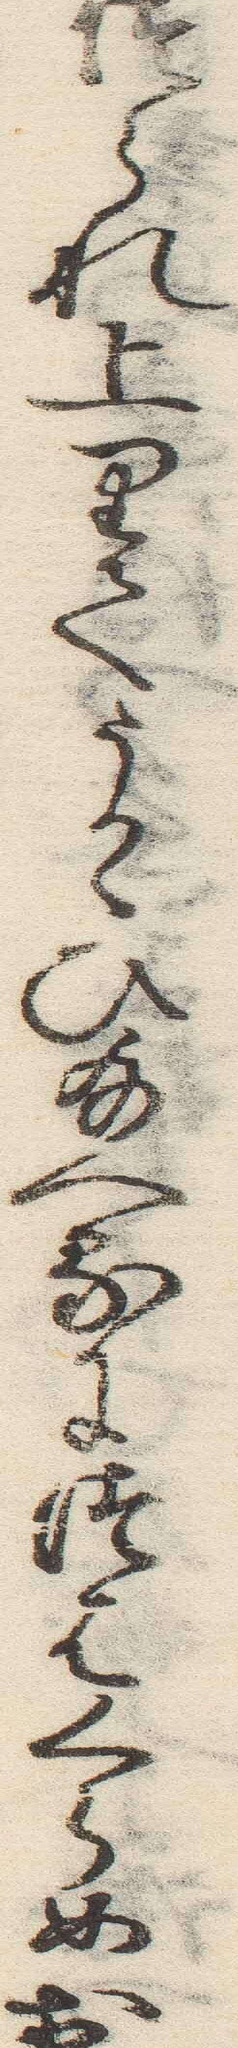つられ上りてうかゝひ給へるにつはくらめお
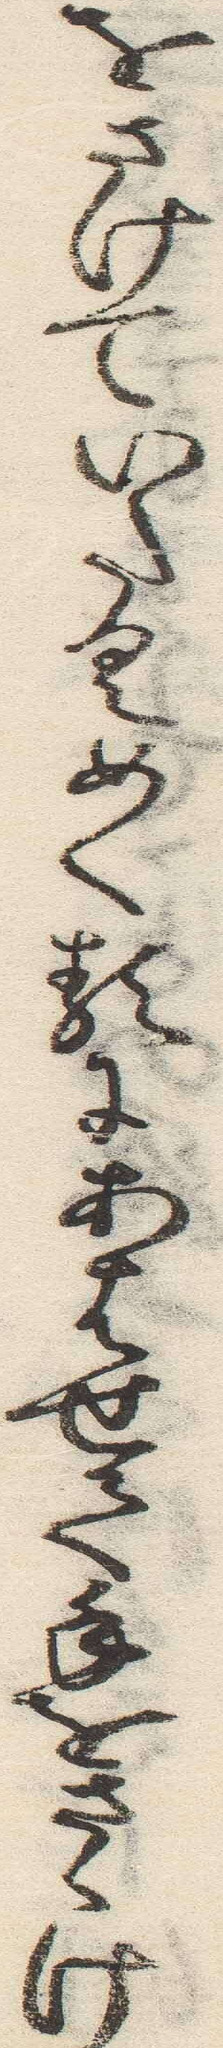をさけていたくめくるにあはせて手をさゝけ
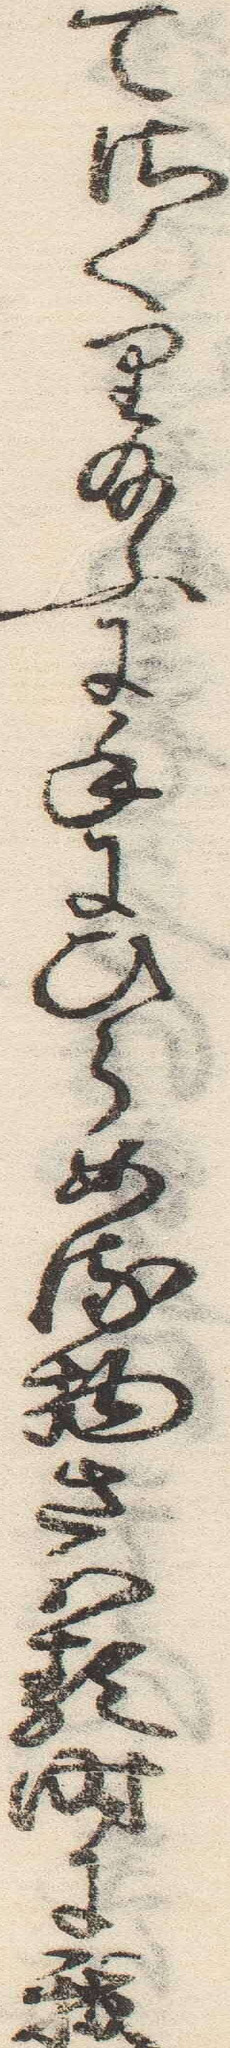てさくり給ふに手にひらめる物さはる時に我
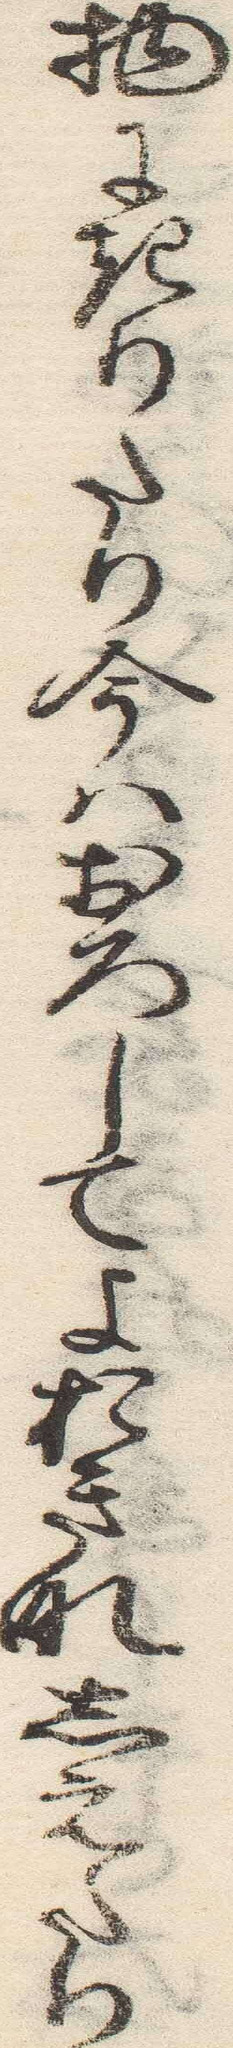物にきりたり今はおろしてよおきなしえたり
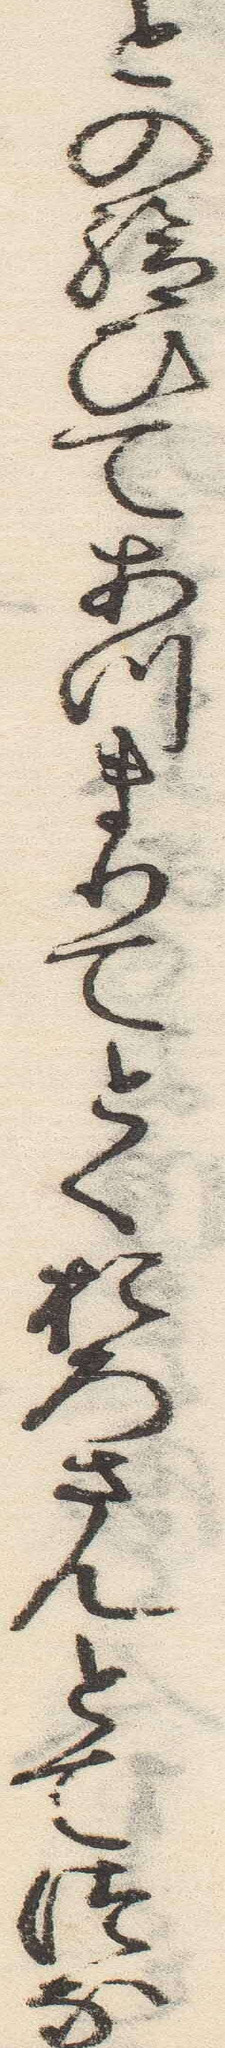との給ひてあつまりてとくおろさんとてつな
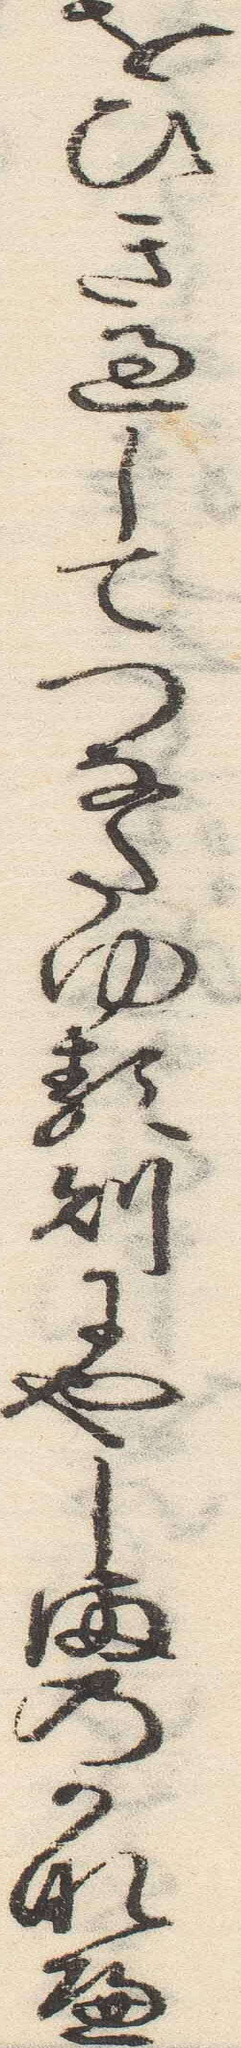をひき過してつなたゆる則にやしまのかなへ
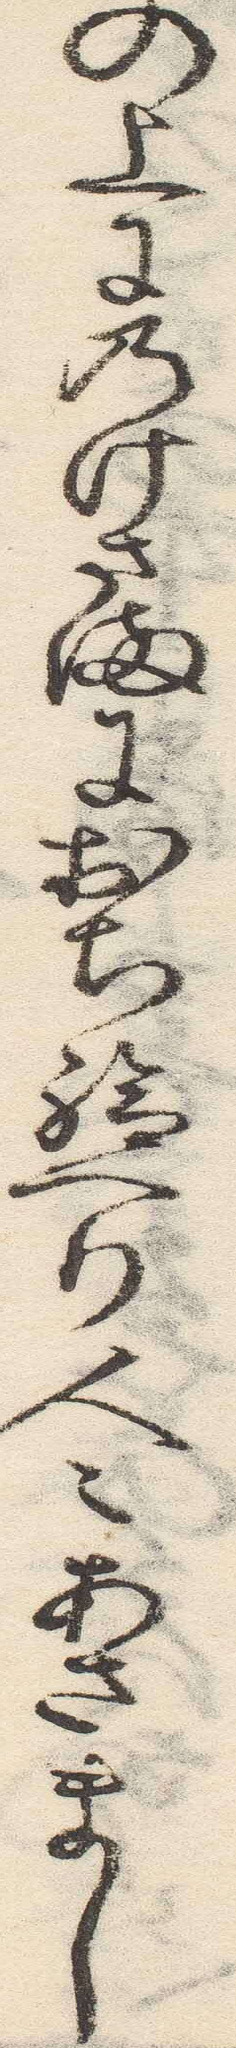の上にのけさまにおち給へり人々あさまし
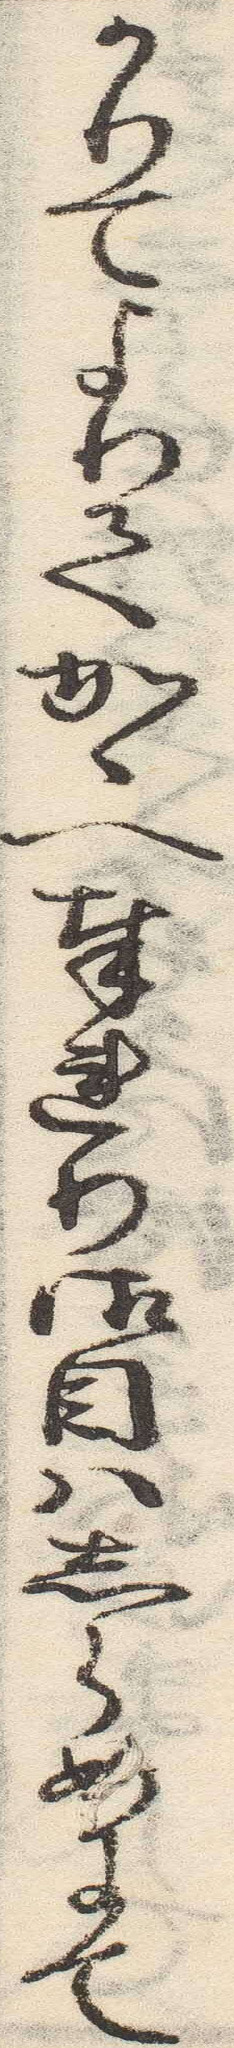かりてよりてかゝへ奉れり御目はしらめにて
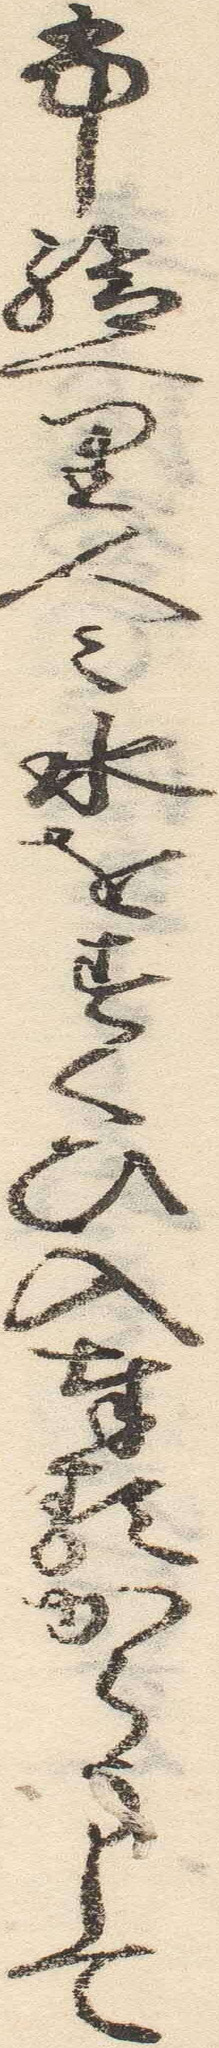ふし給へり人々水をすくひ入奉るからうして
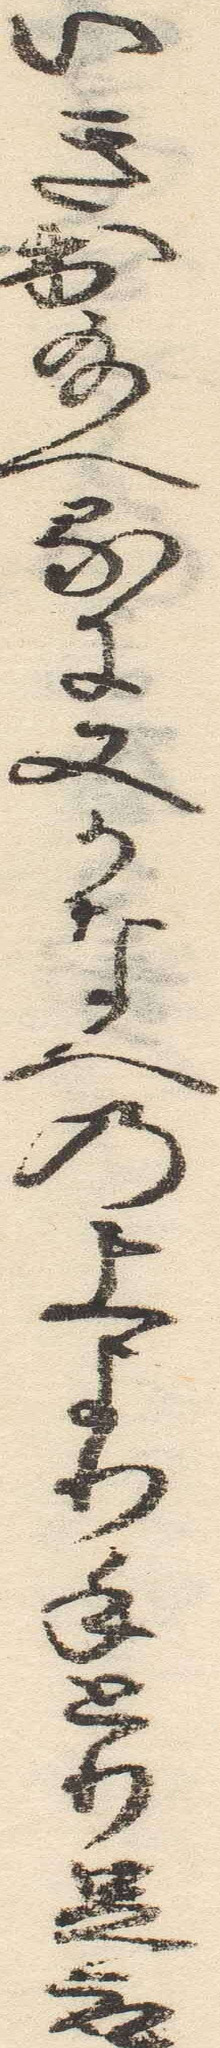いき出給へるに又かなへの上より手とり足取
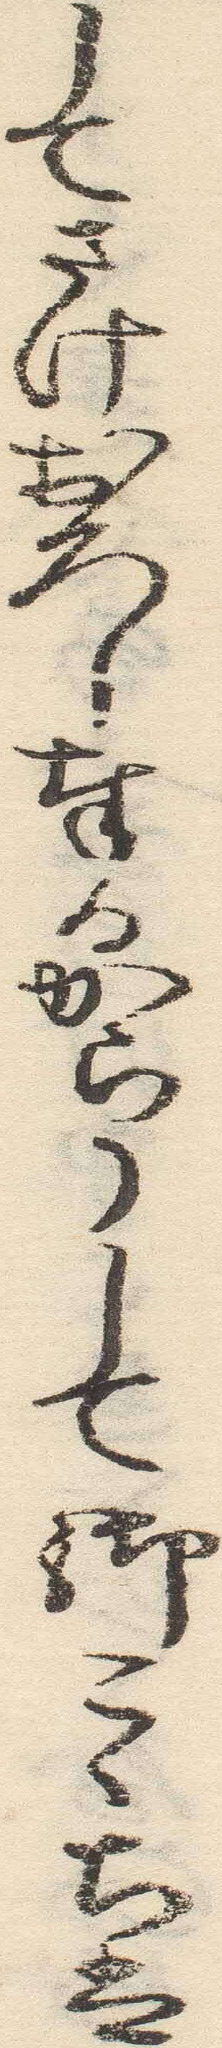してさけおろし奉るからうして御こゝちは
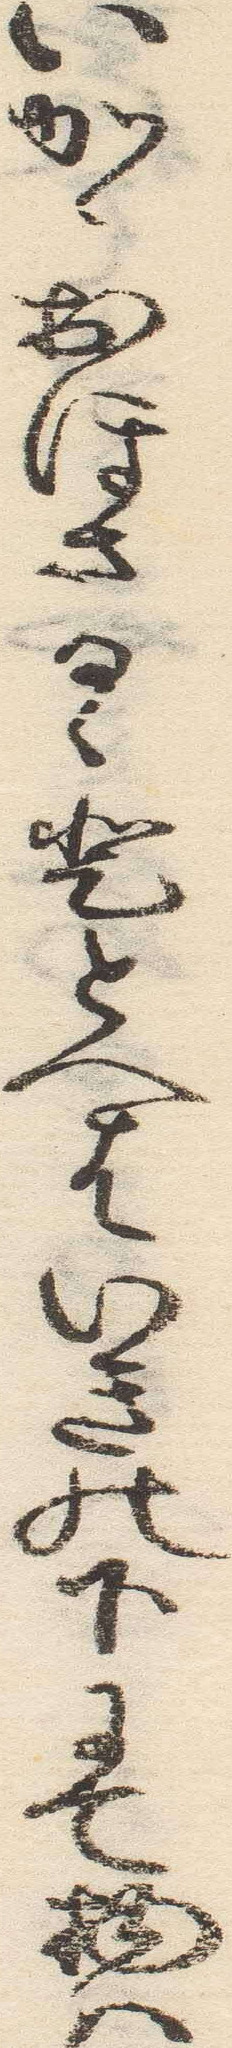いかゝおほさるゝととへはいきの下にて物は
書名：竹取物語
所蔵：東京学芸大学附属図書館 国文学研究資料館
